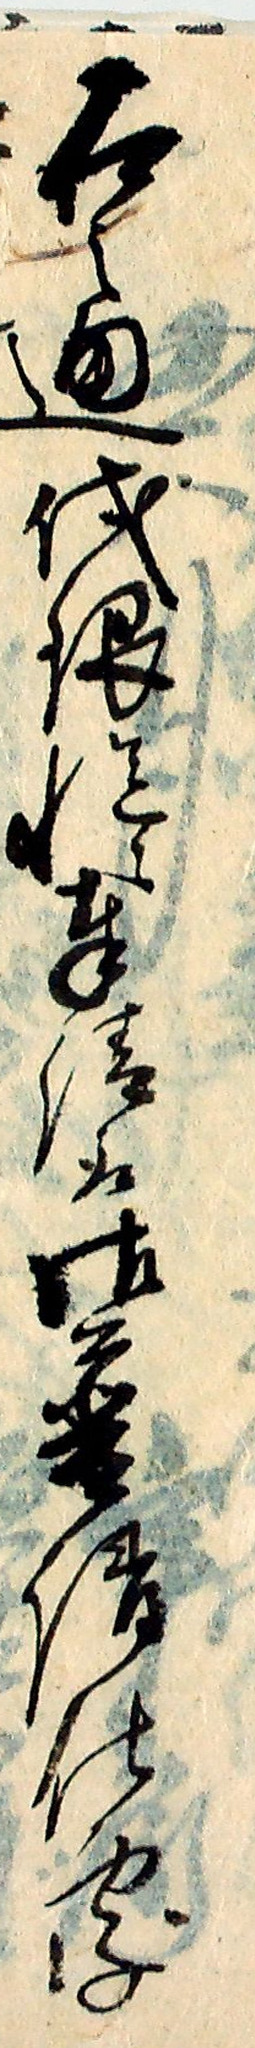右之通代銀慥に奉請取御普請仕処
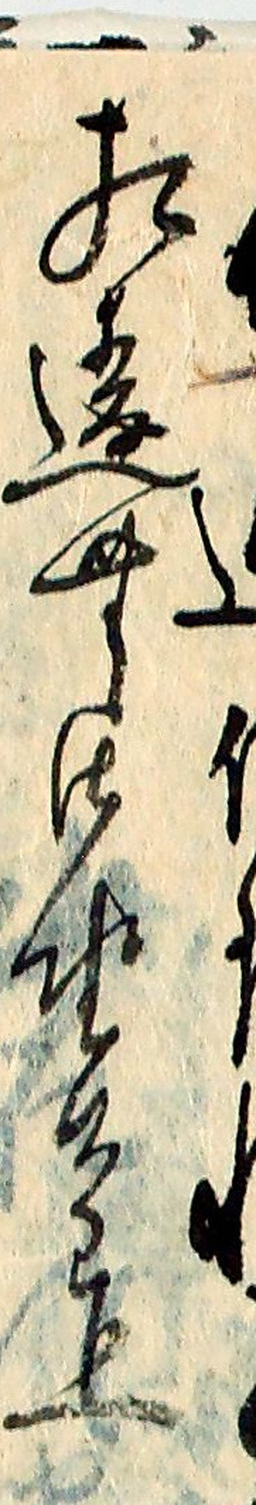相違無御座候已上
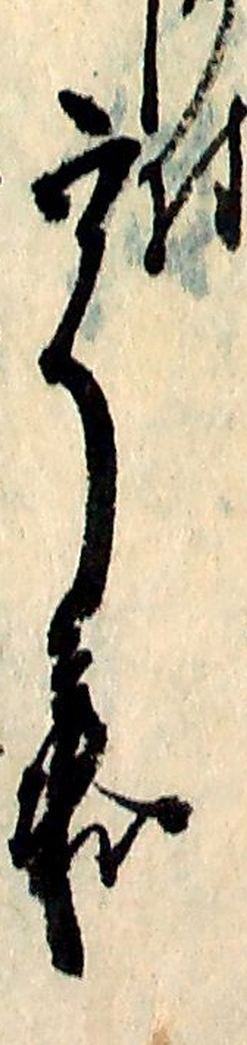宇兵衛
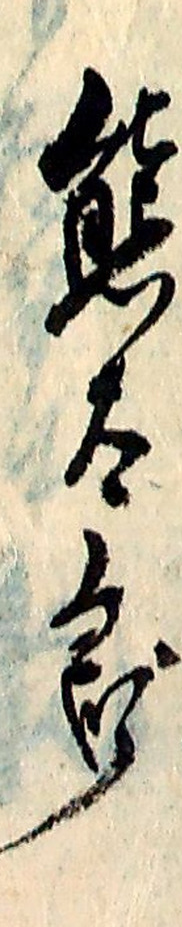熊太郎
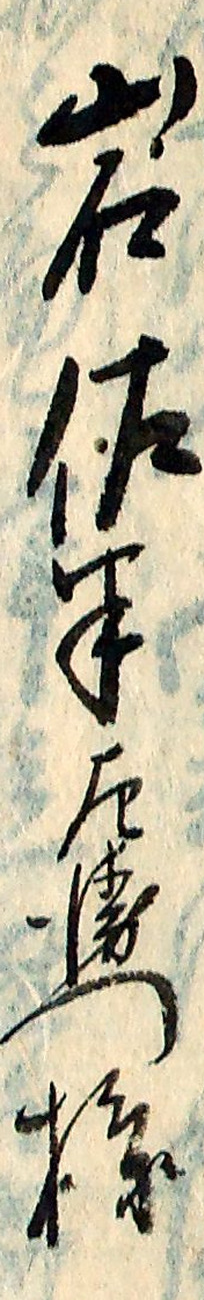岩佐半左衛門様

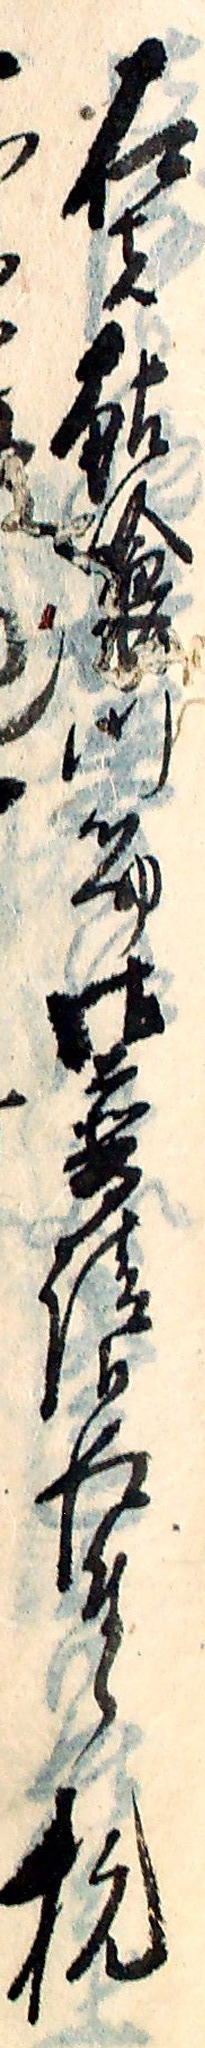右は鮎喰川筋御普請被仰付候杭
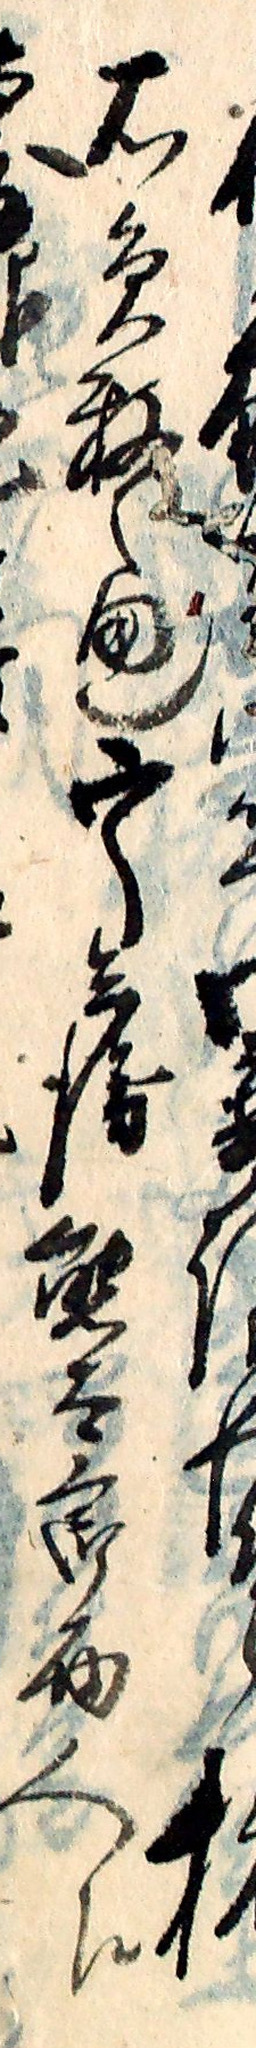右員数之通宇兵衛熊太郎両人え
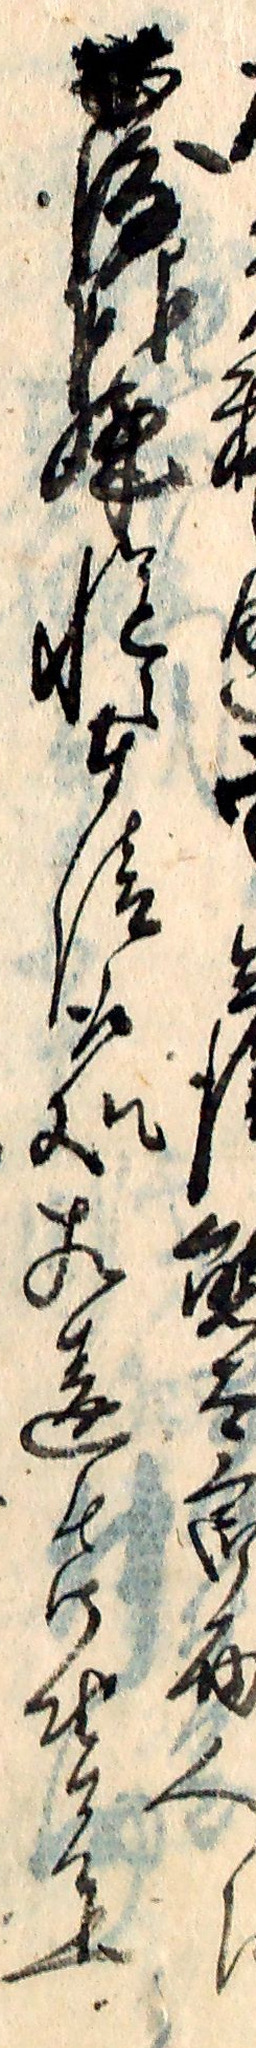御渡被遊慥に奉請取処相違無御座候已上
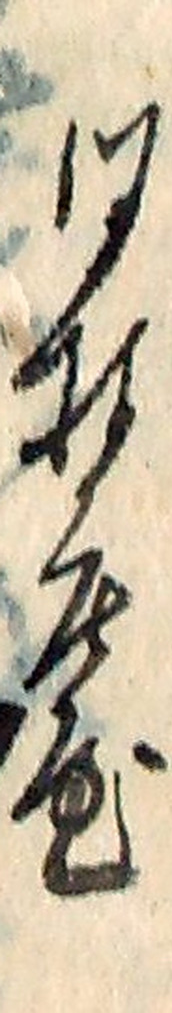同村庄屋
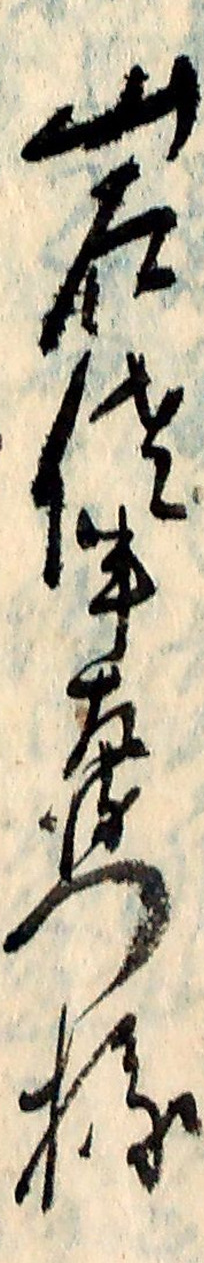岩佐半左衛門様
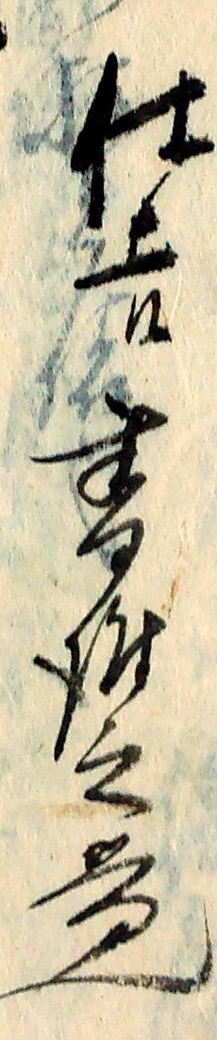仕上候書附之覚
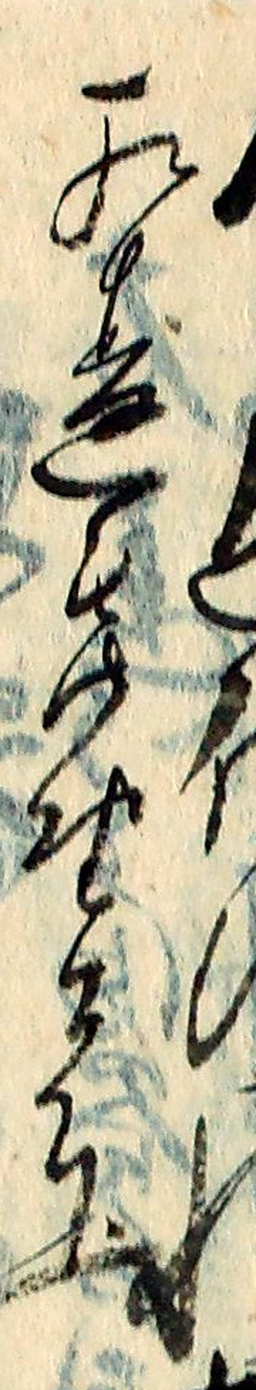相違無御座候已上
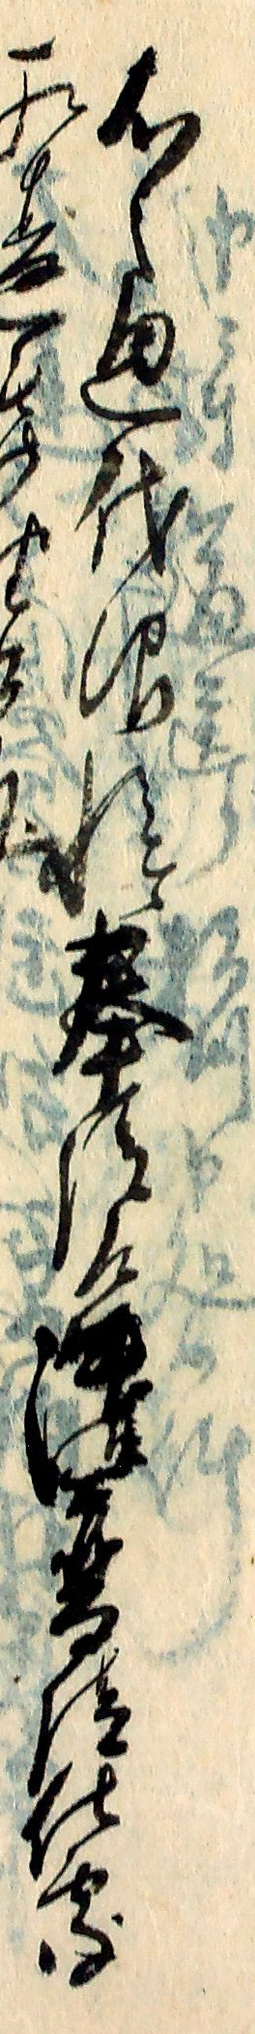右之通代銀慥に奉請取御普請仕処
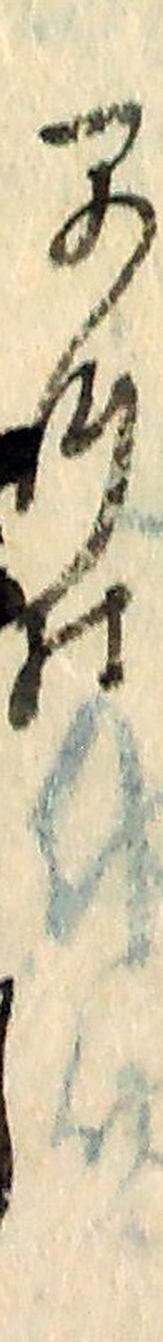早淵村
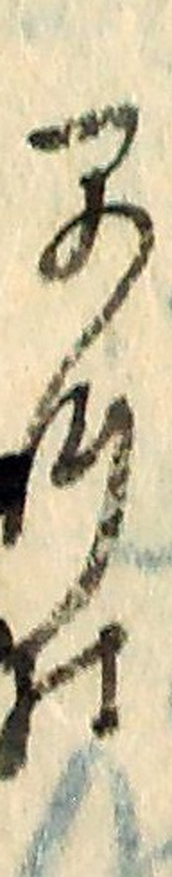早淵村
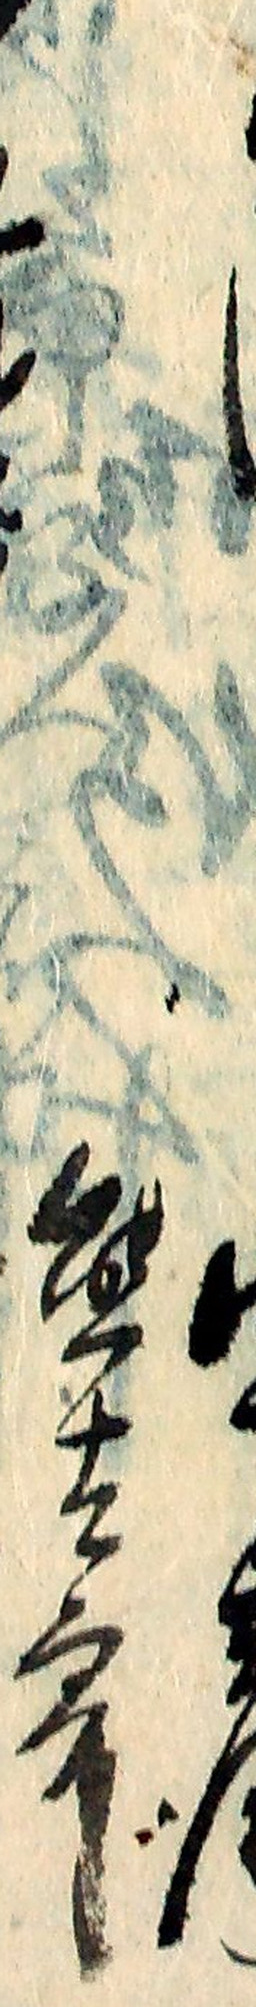熊太郎
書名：諸御願書控(後藤氏壱番）
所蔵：鳴門教育大学 Naruto University of Education
